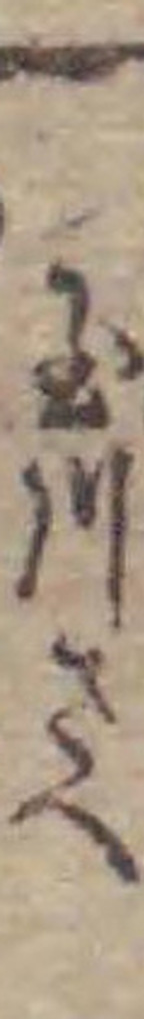玉川さへ
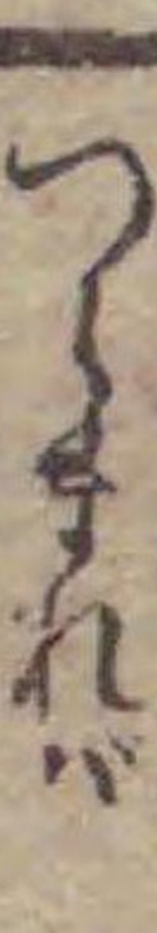つらまれば

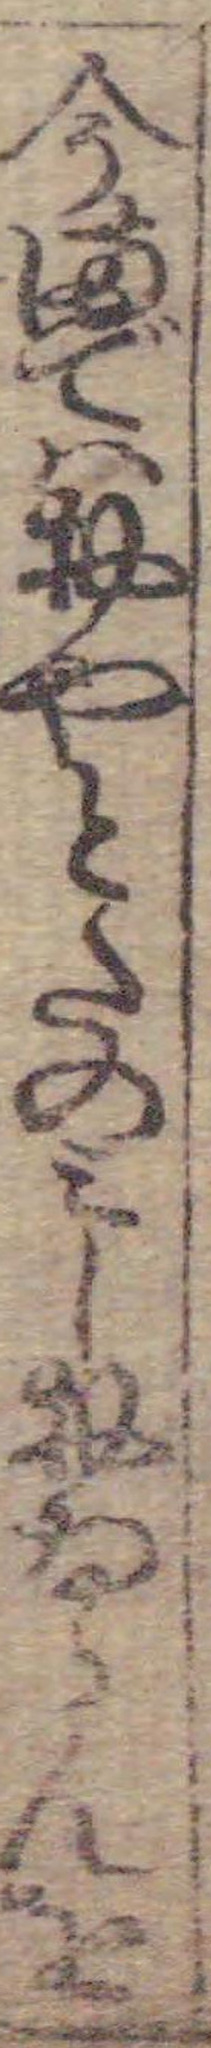今まではおやとたのみしおゐらんを
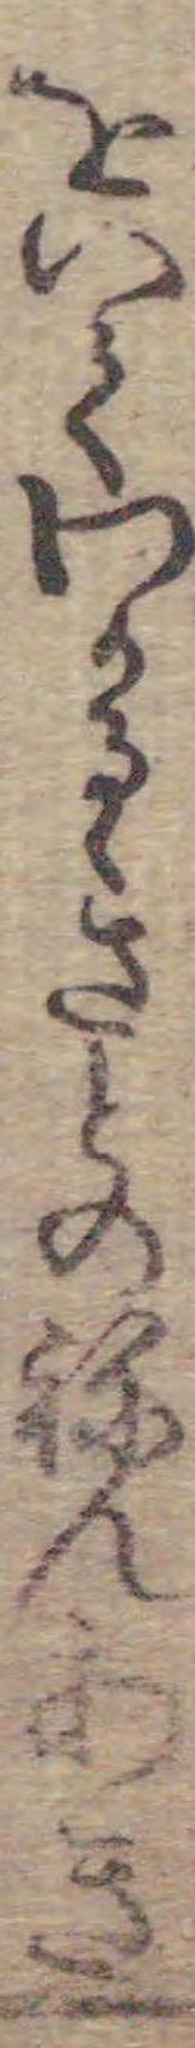をいてわかるゝさとのねんあき
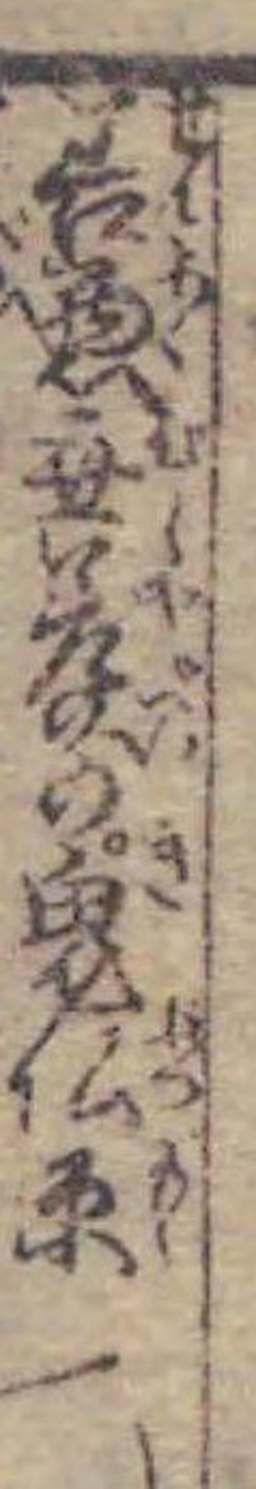善悪無差別。鬼仏原
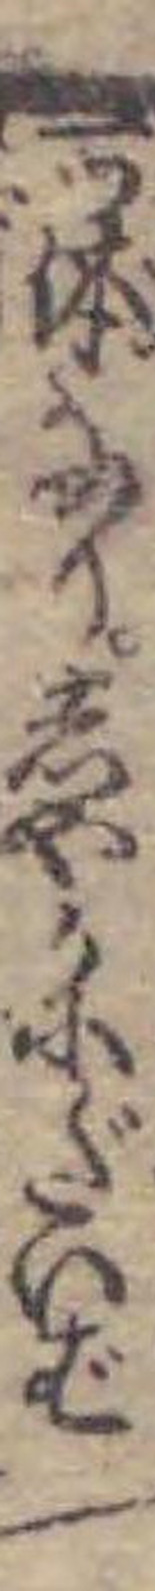一つ体なり。しやかにだいば
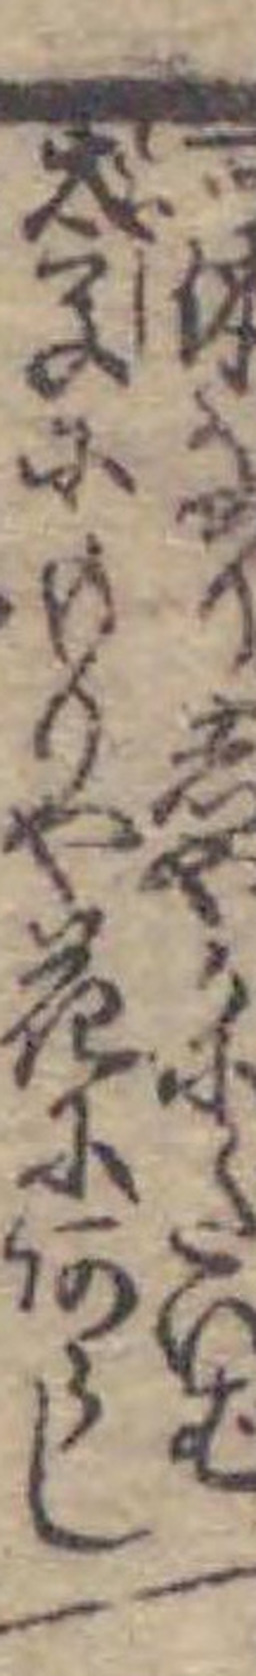太子にもりや花にあらし
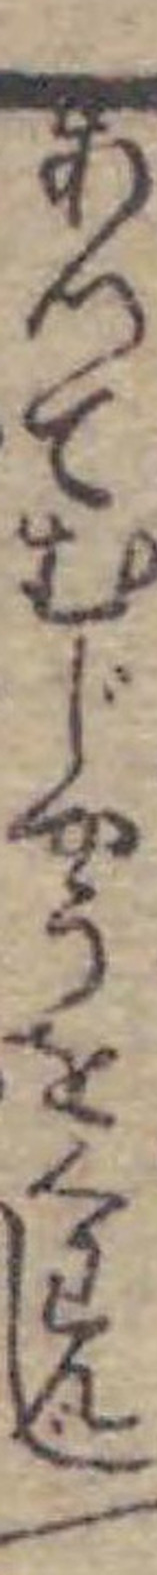あつてむじやうをくわんじ
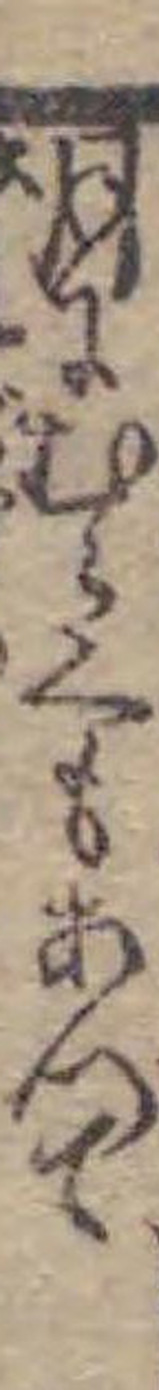月にむらくもあつて
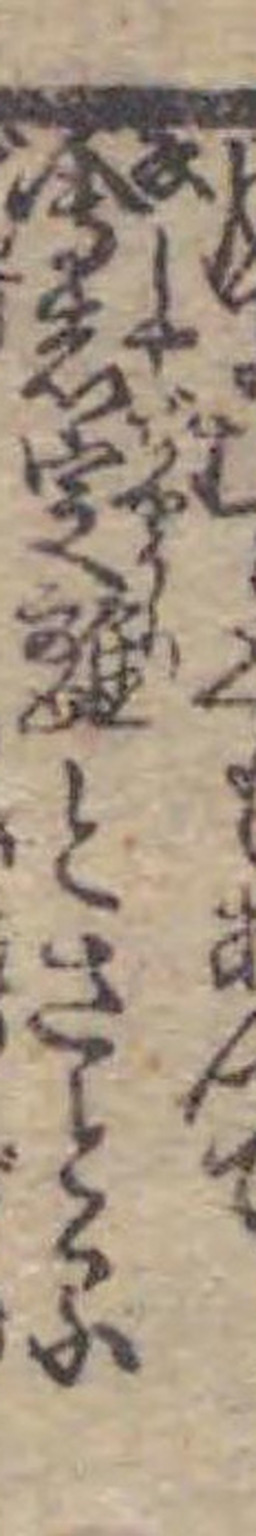会者定離とさとる
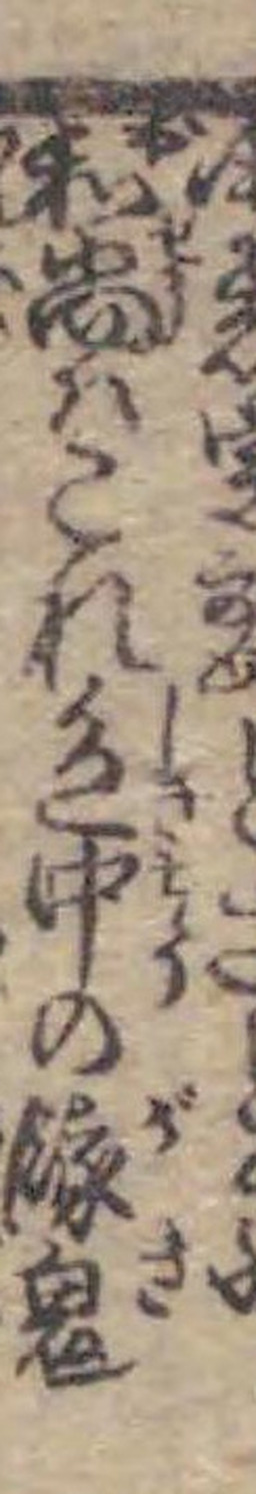和尚はこれ色中の餓鬼
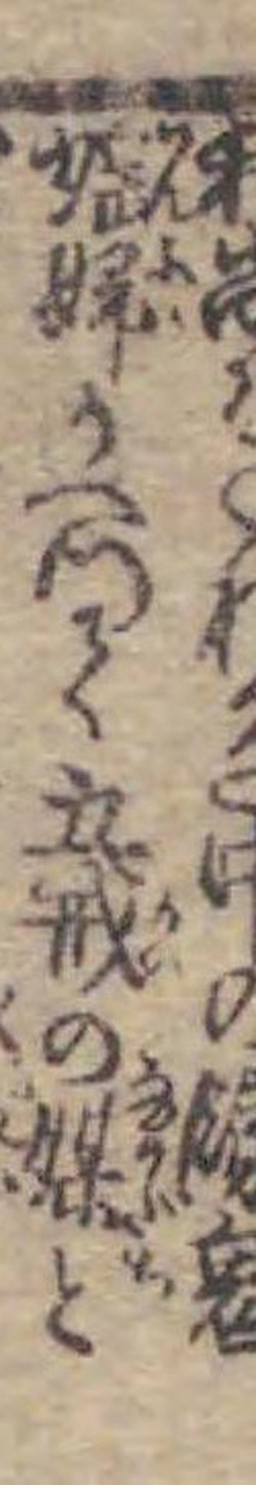婬婦かへつて五戒の媒と
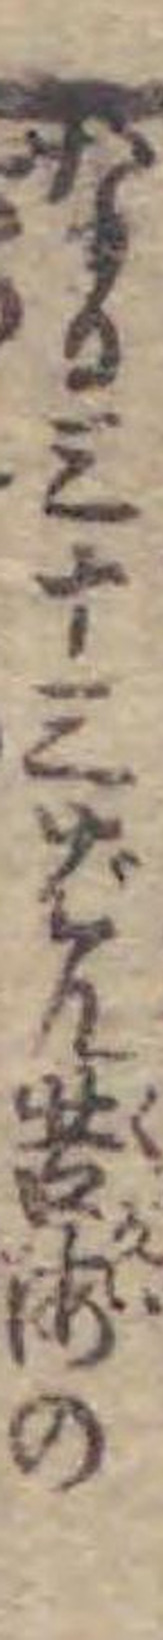なる三十三ばん苦海の
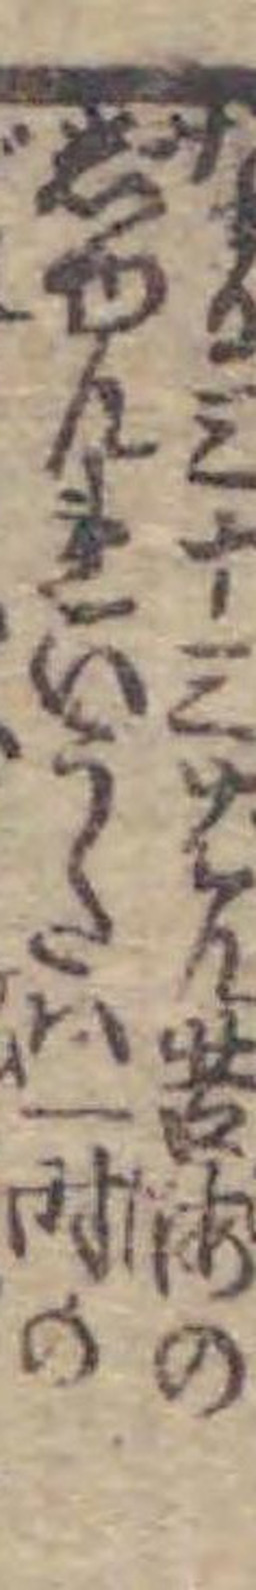じゆんれいうたは一時の
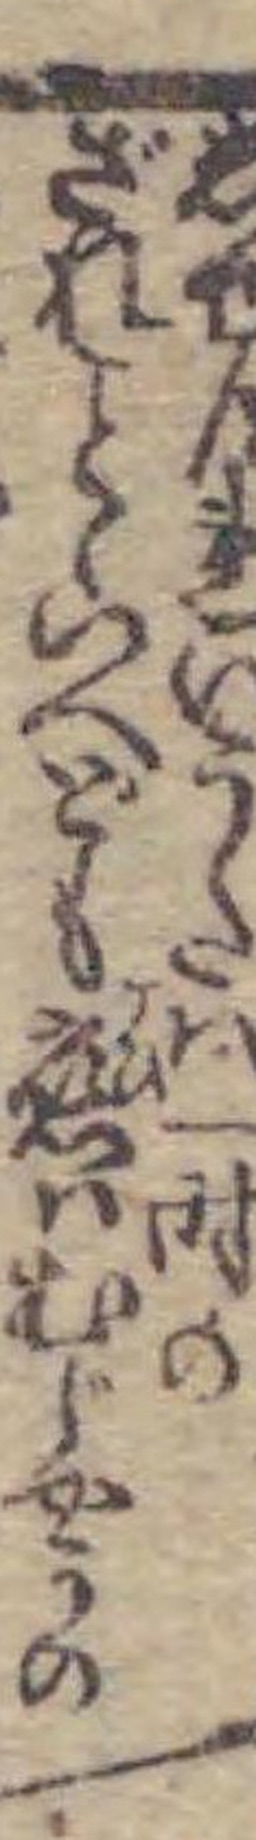ざれことゝいへども恋はむじやうの
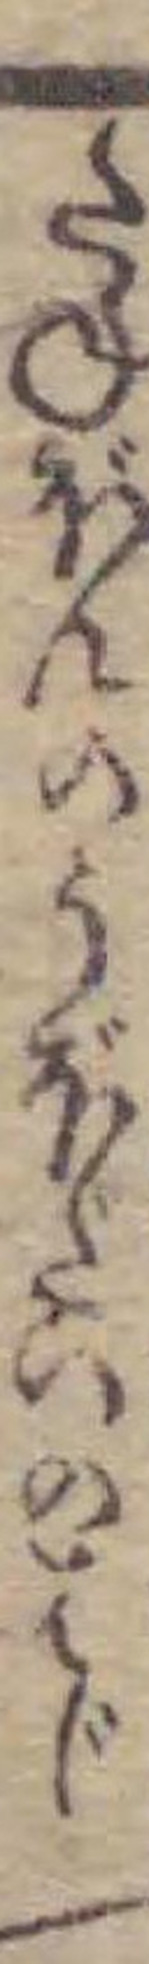たねぼんのうぼだいのはじ
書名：北国順礼唄方便 : 3巻
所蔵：国立国会図書館 National Diet Library, JAPAN
